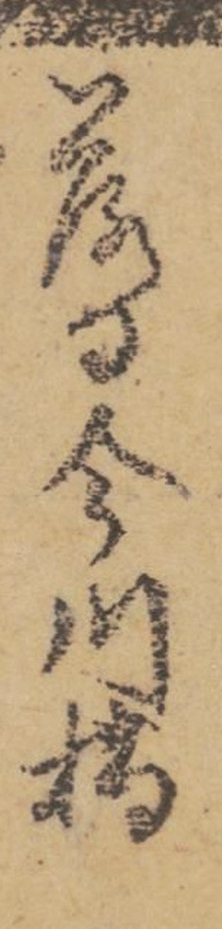落る今川橋
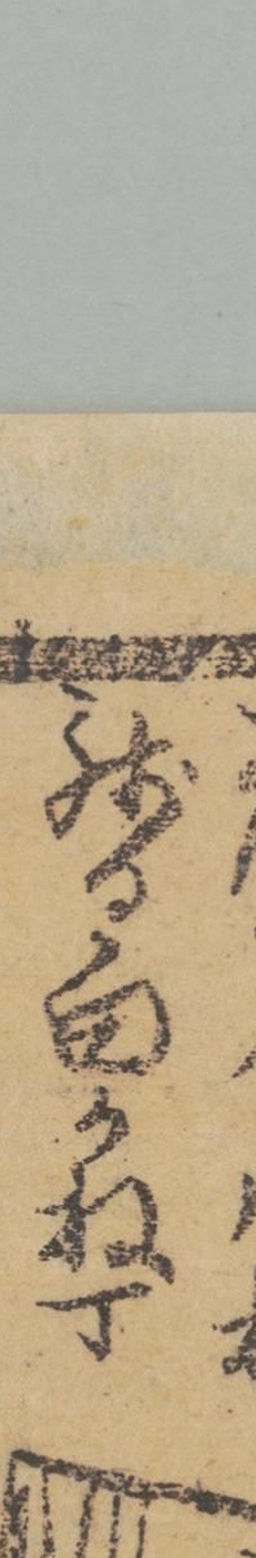残る白かね丁
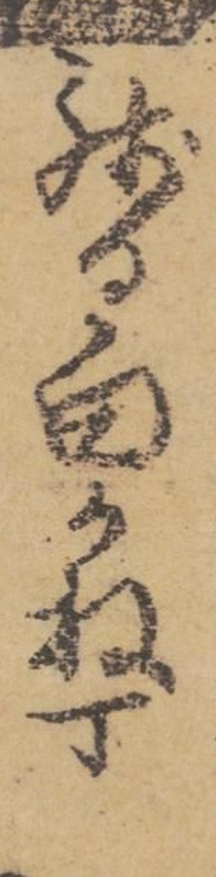残る白かね丁
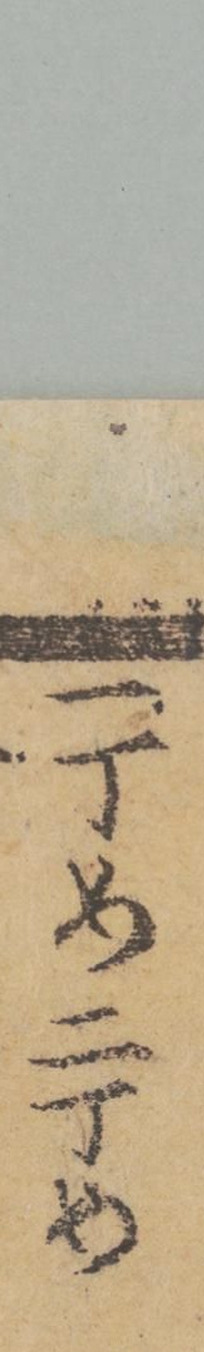丁二丁め一丁め小
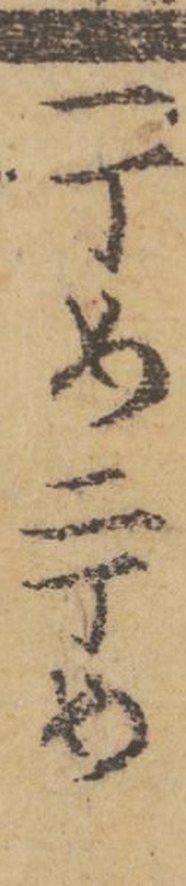一丁め二丁め
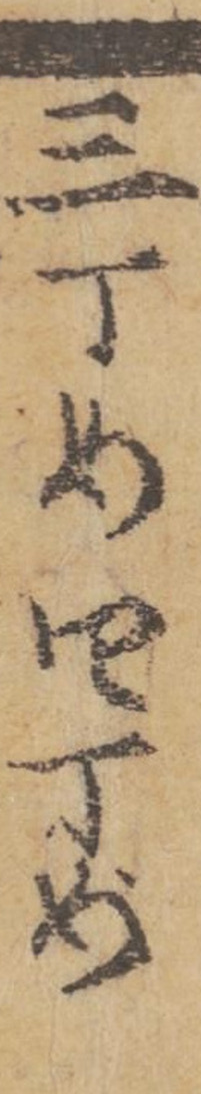三丁め四丁め
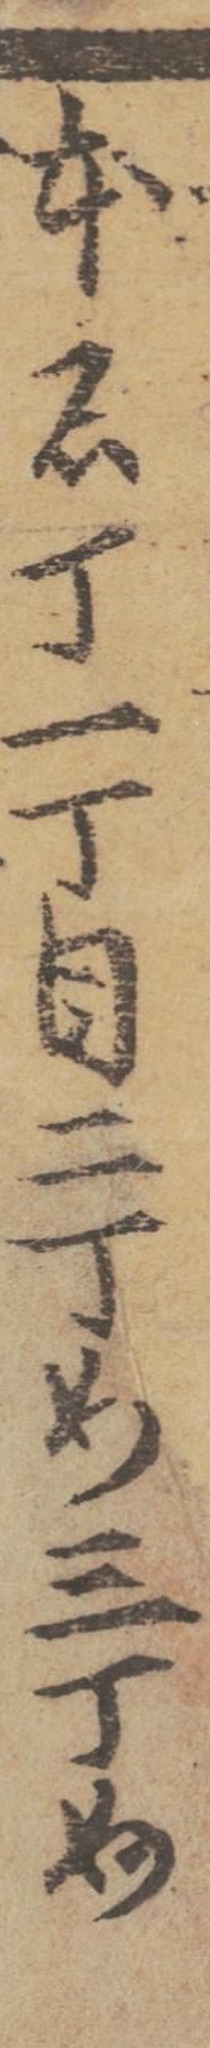本石丁一丁め二丁め三丁め
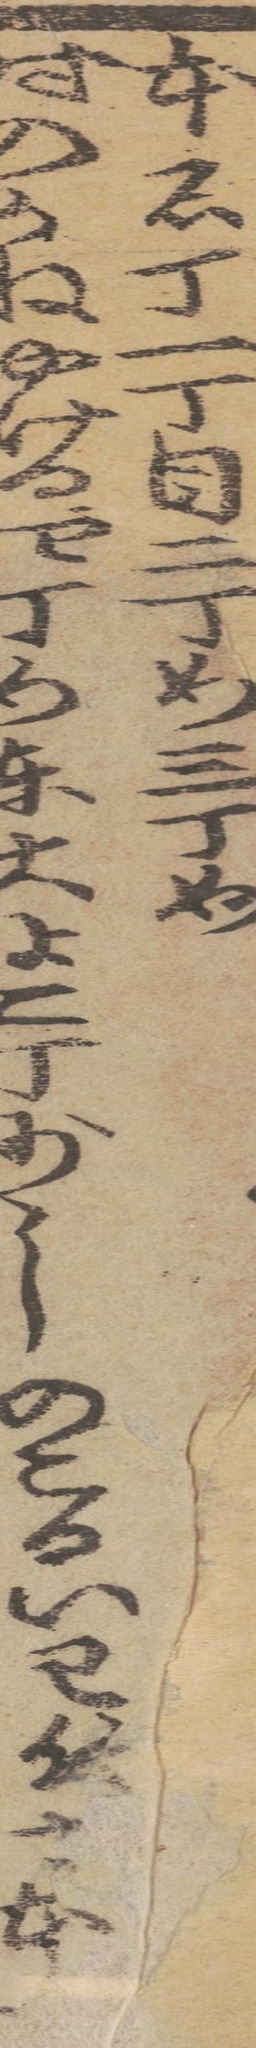時のかねやける四丁め東大よこ丁少しのこるいわさ本
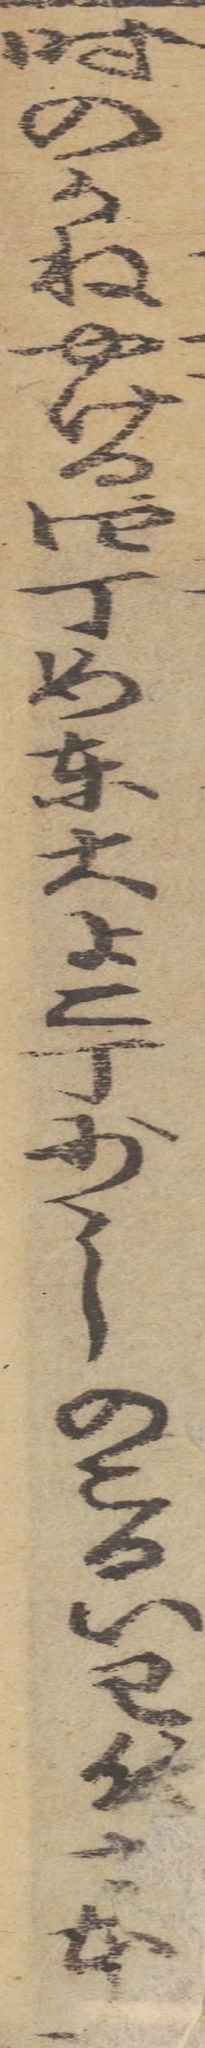時のかねやける四丁め東大よこ丁少しのこるいわさ本
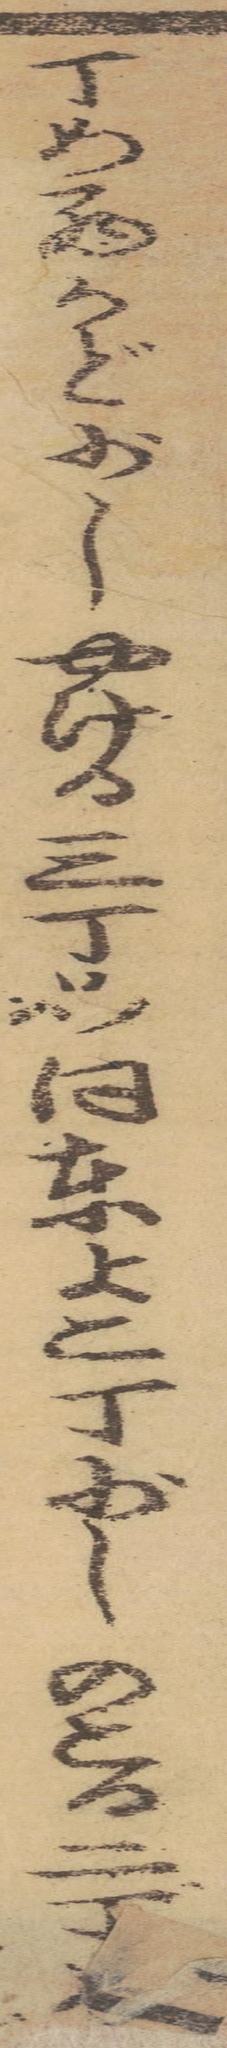丁め西かど少しやける三丁め同東よこ丁少しのこる二丁め
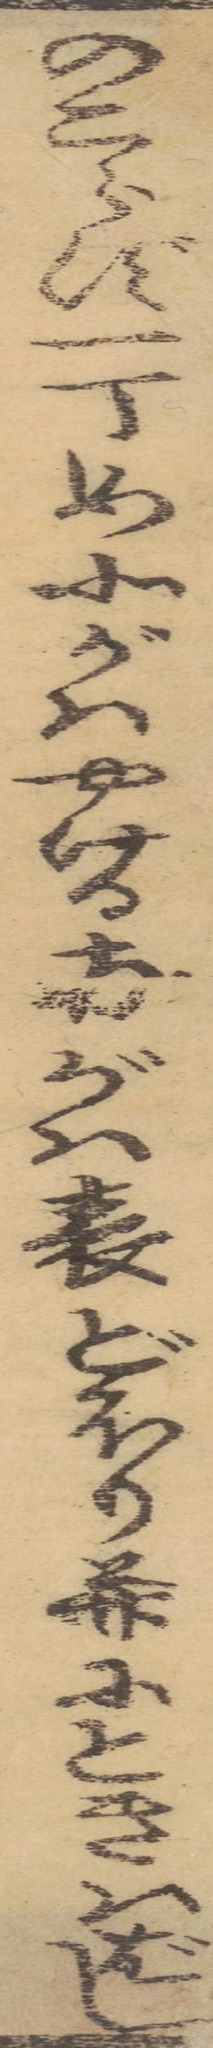のこらず一丁め北がはやける南がは表どほり并にときはばし
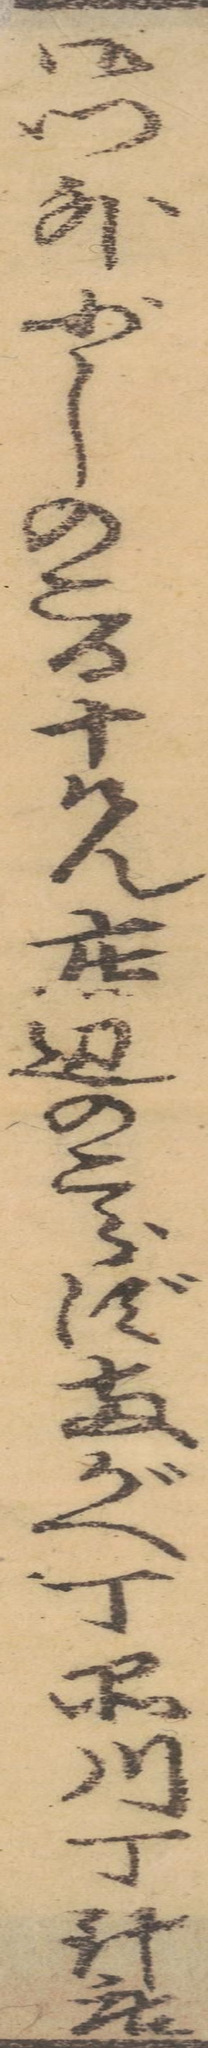御門外少しのこる十けん店辺のこらず両がへ丁品川丁針店
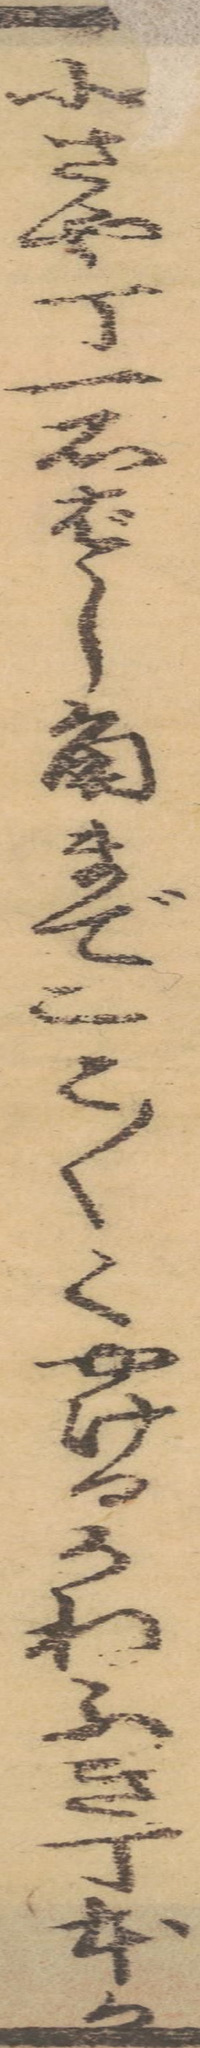北さや丁一石ばし角までこと〴〵くやけるかわふき丁本か
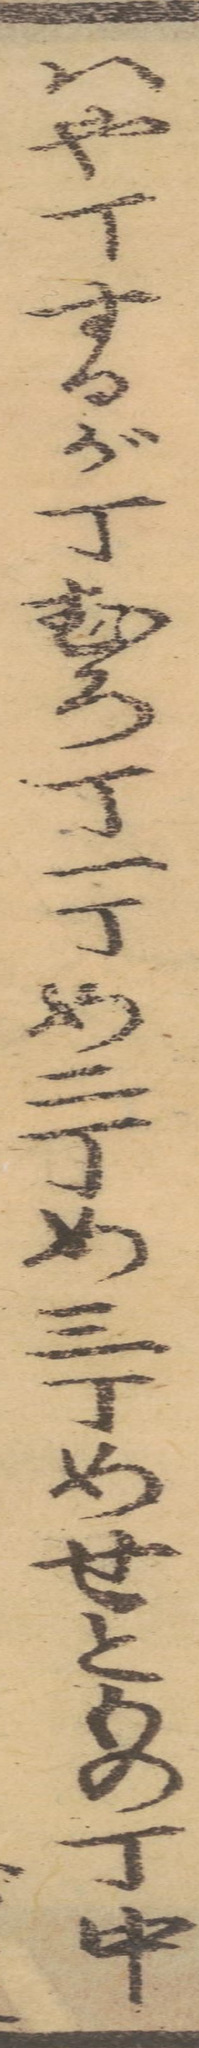はや丁するが丁むろ丁一丁め二丁め三丁めせともの丁中
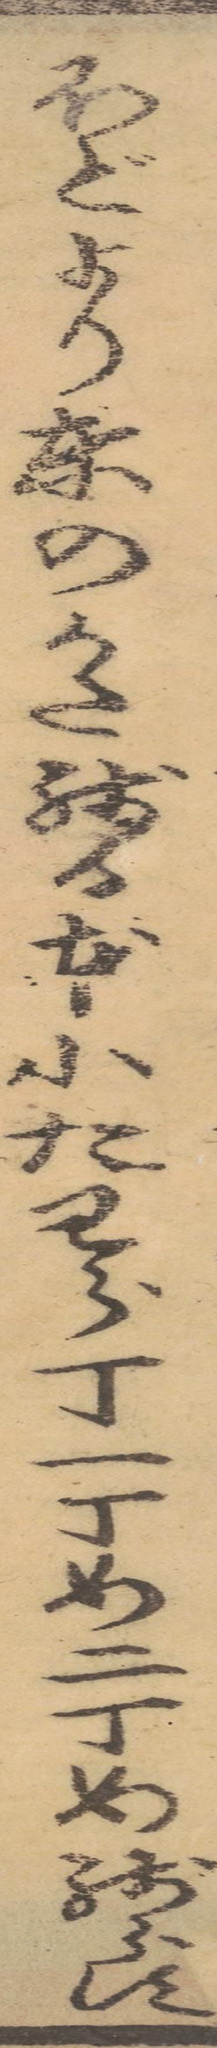ほどより東のかた残る本小たわら丁一丁め二丁め残らす
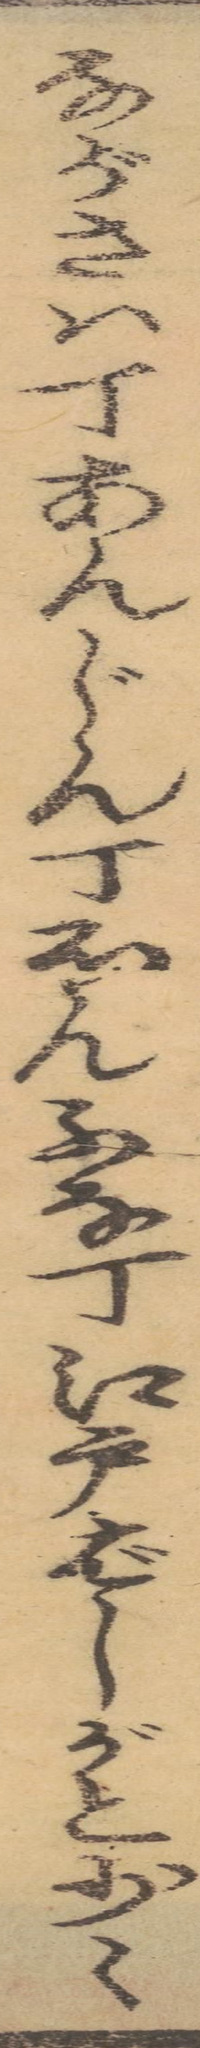ながさは丁あんじん丁ほんふな丁江戸ばしがと少々
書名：[安政元年十二月の江戸大火に関する瓦版]
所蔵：東京大学地震研究所図書室 Earthquake Research Institute Library, The University of Tokyo, JAPAN
